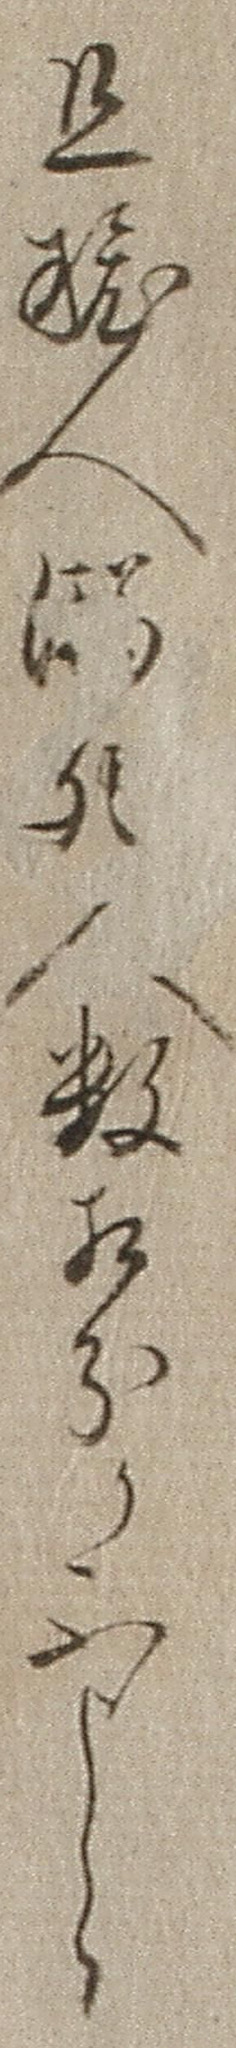且旅人溺死人数相分り不申候
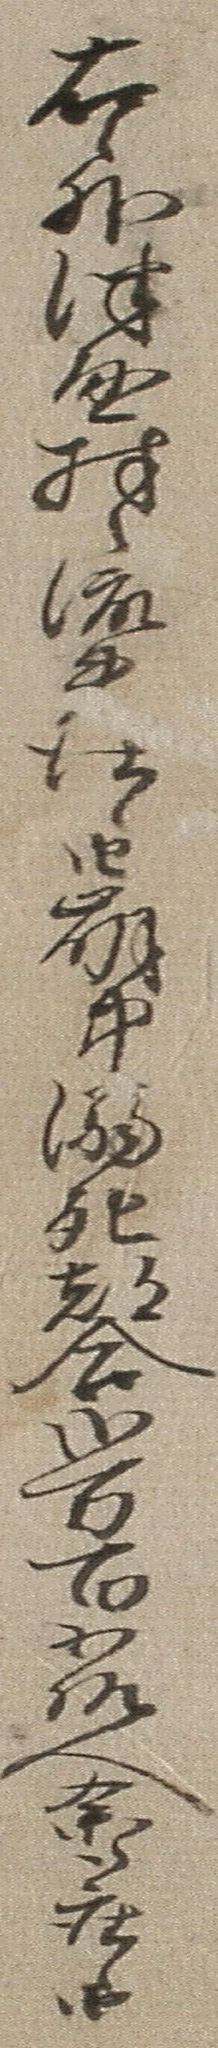右之外津通村々流出仕候由崩中溺死都合弐万百五拾人余御座候由
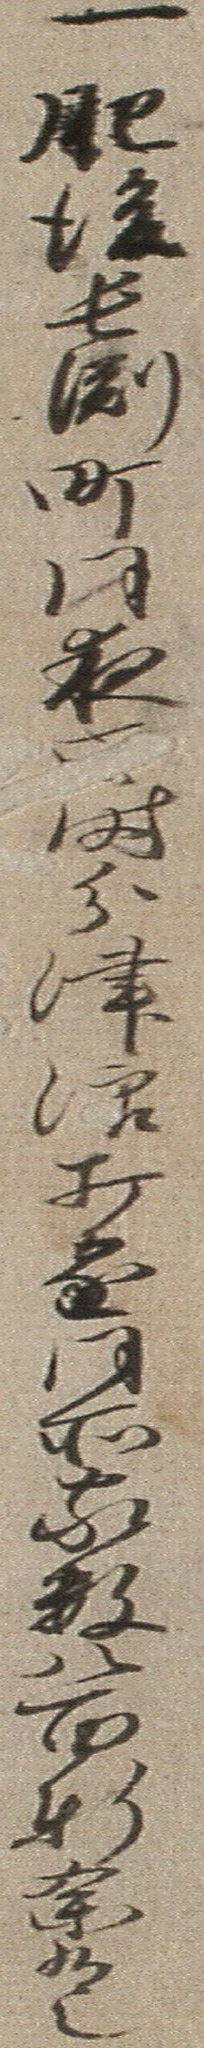一肥後長渕町同夜六ッ時分津浪打懸同所家数八百軒余有之
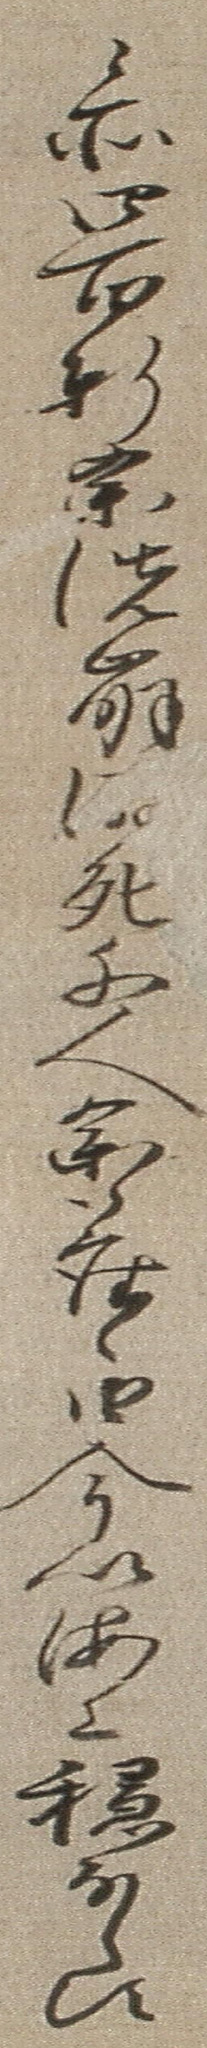候所四百軒余洗崩溺死千人余御座候由今以海上穏ならす
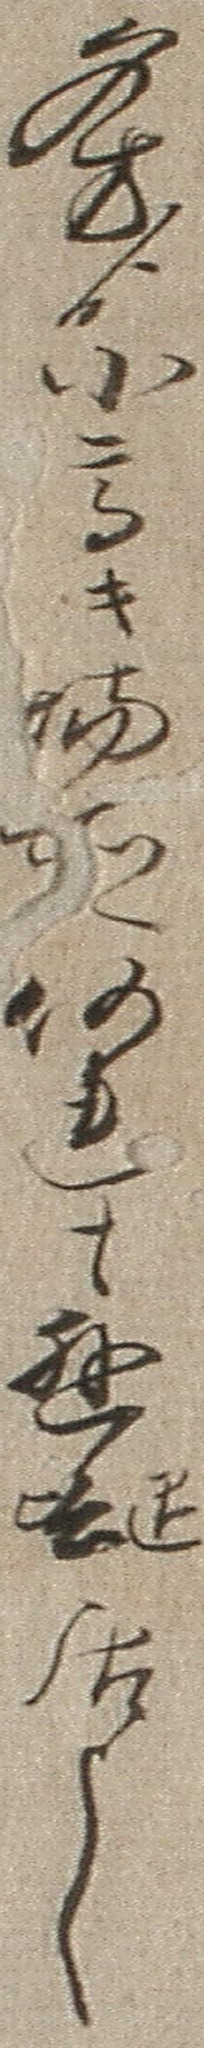夕方ゟ小高き場所へ何れも逃退居申候
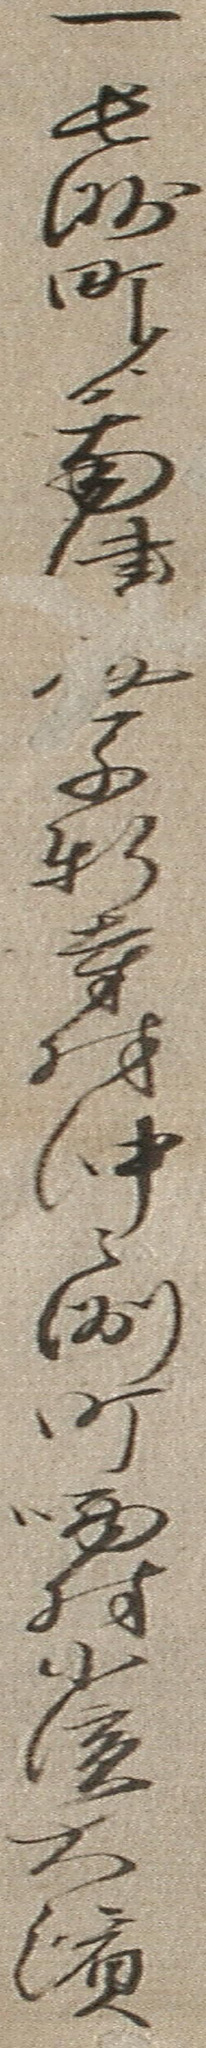一長渕町ゟ南津通千軒寺村沖之渕町唖村小浜大浜
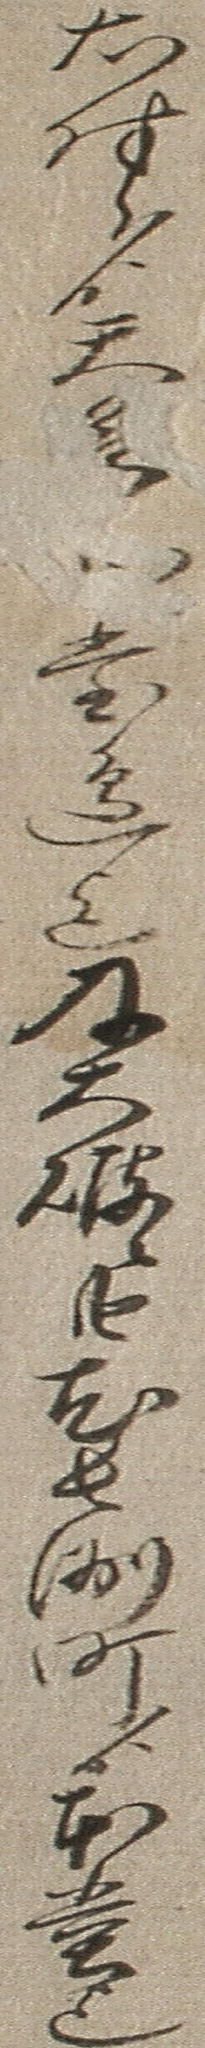右村々ゟ天草辺迄及大破に候由尤長淵町ゟ本堂迄
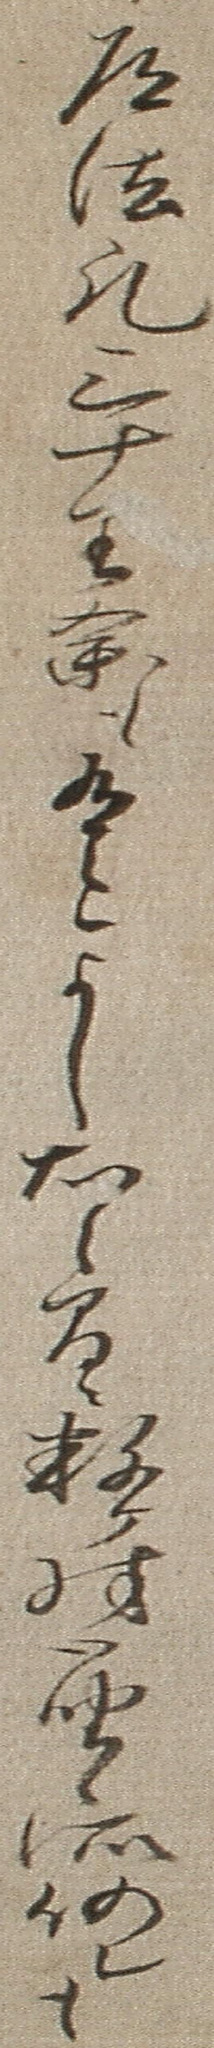道法凡三十里余も有之候よし右之間に数ヶ村御座候所何ㇾも
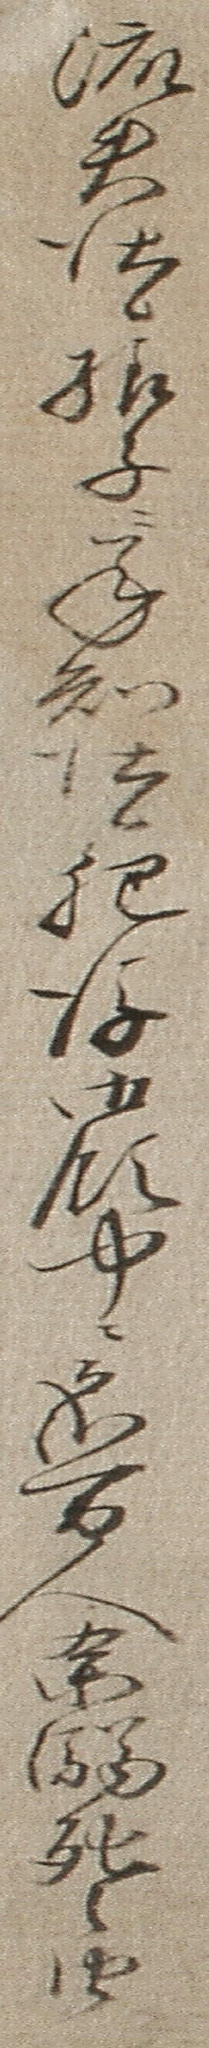流失仕候様子に承知仕候肥後御領中に而弐万人余溺死候由
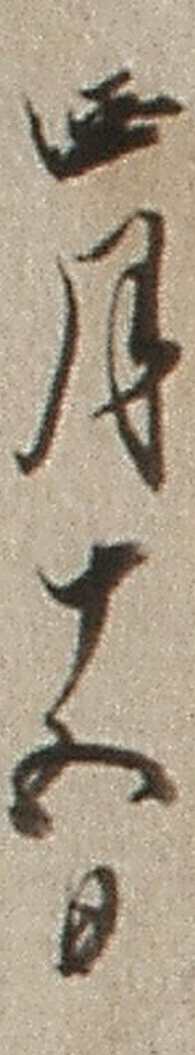正月十五日
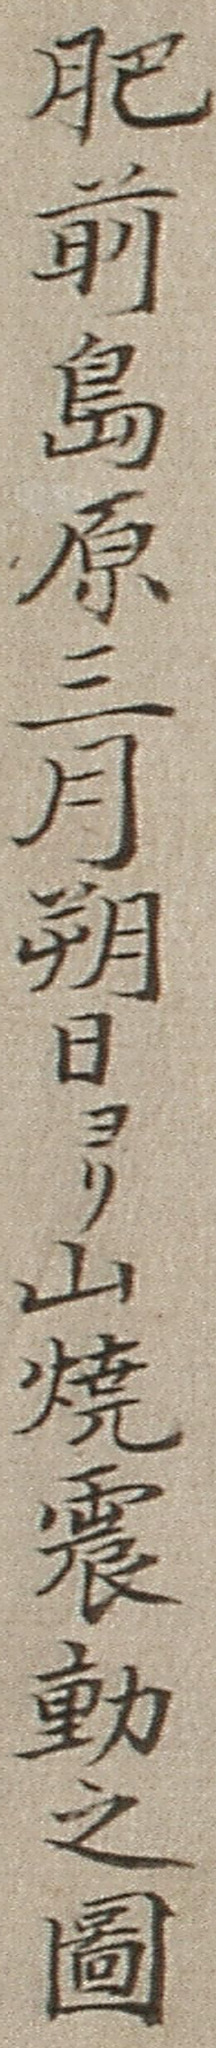肥前島原三月朔日より山焼震動之圖

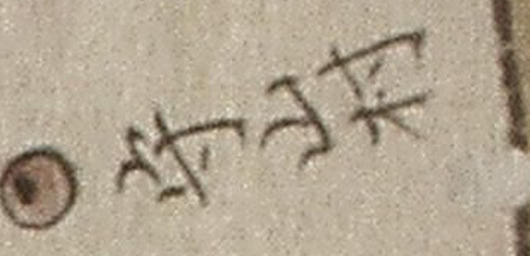●守山村
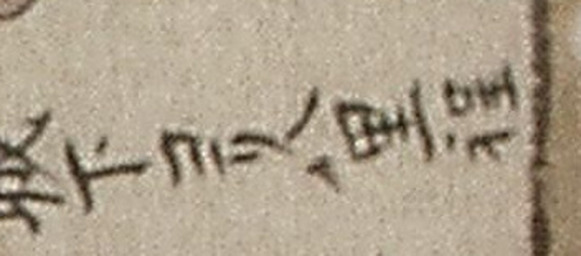御城下ヨリ八里程
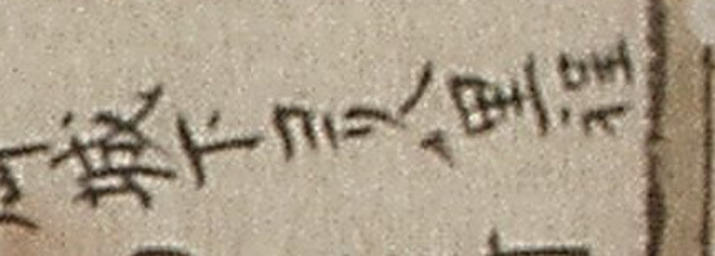御城下ヨリ八里程
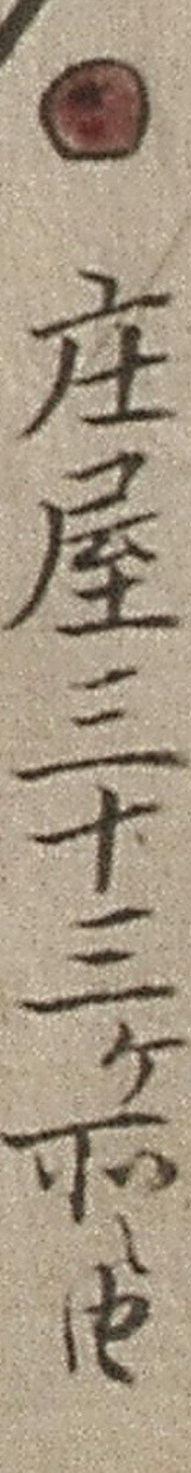●庄屋三十三ヶ所之由
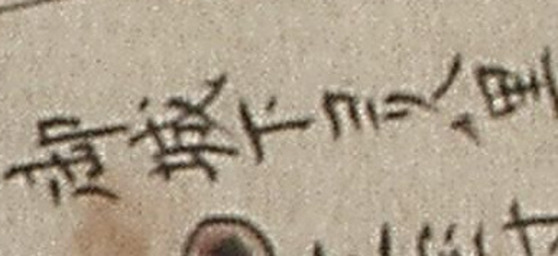御城下ヨリ八里程
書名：太平秘録抜書　浅間山燒及普賢山崩
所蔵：東京大学地震研究所図書室 Earthquake Research Institute Library, The University of Tokyo, JAPAN
